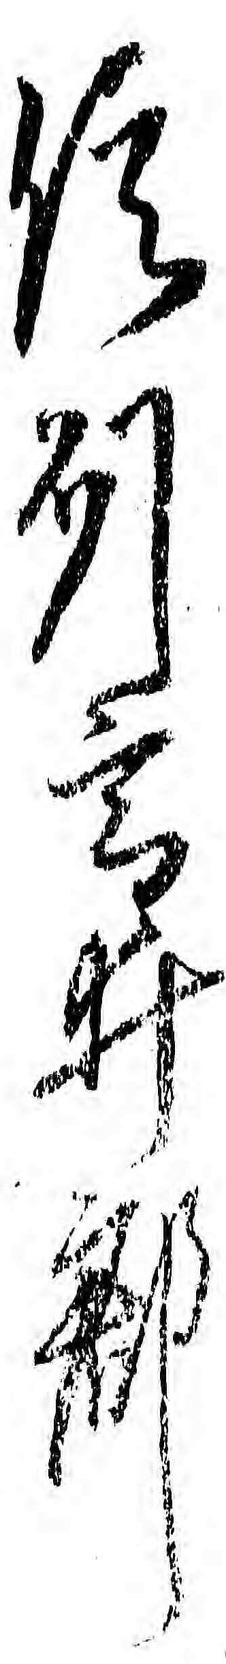信州高井郡
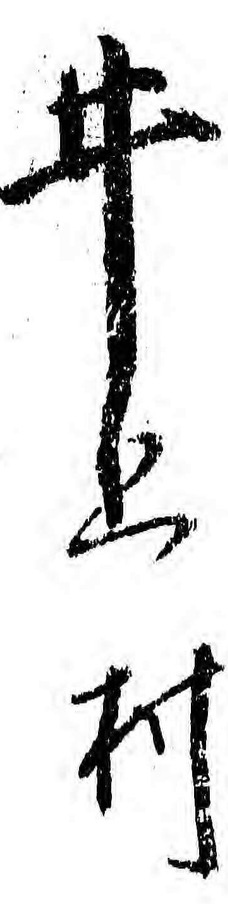井上村
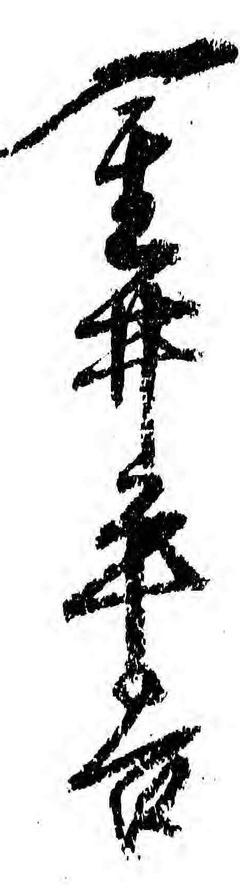金井平吉
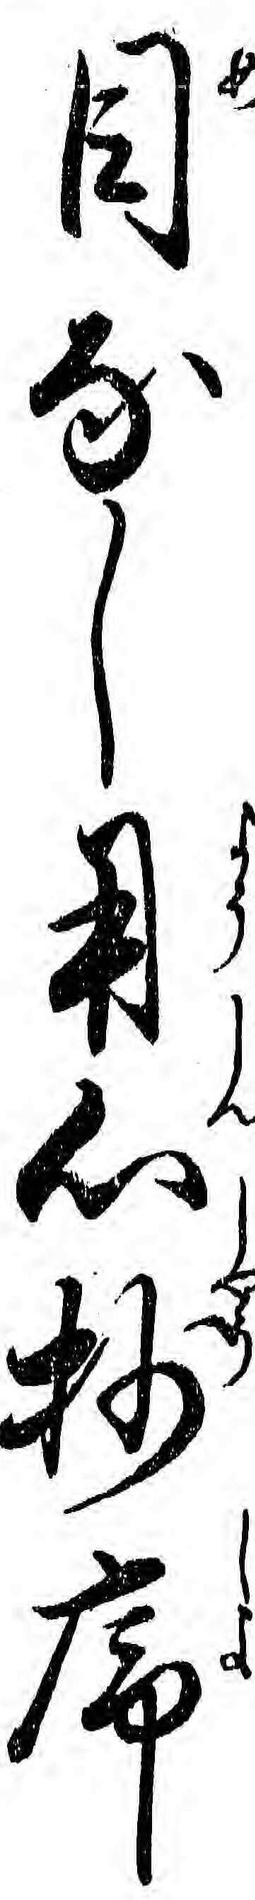目なし用心抄序
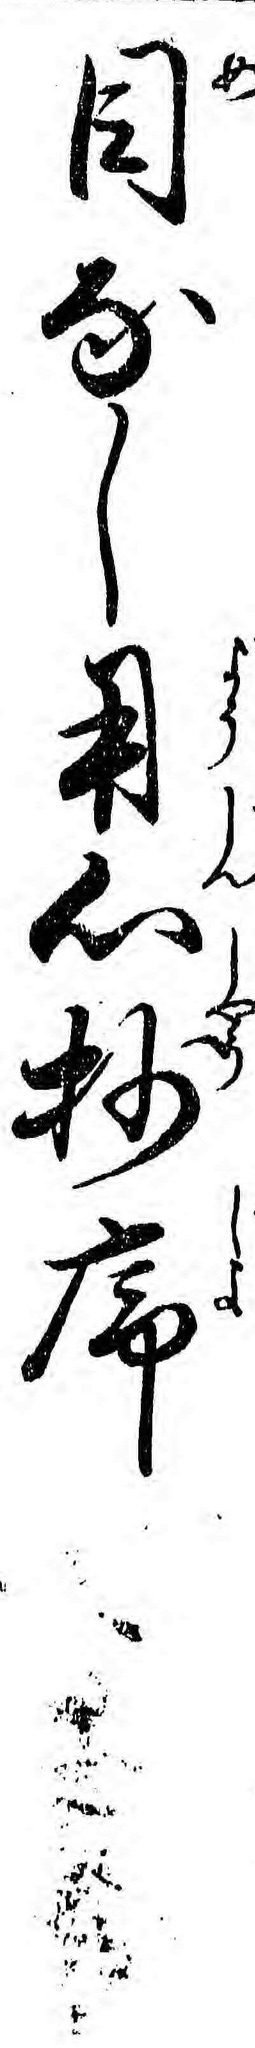目なし用心抄序
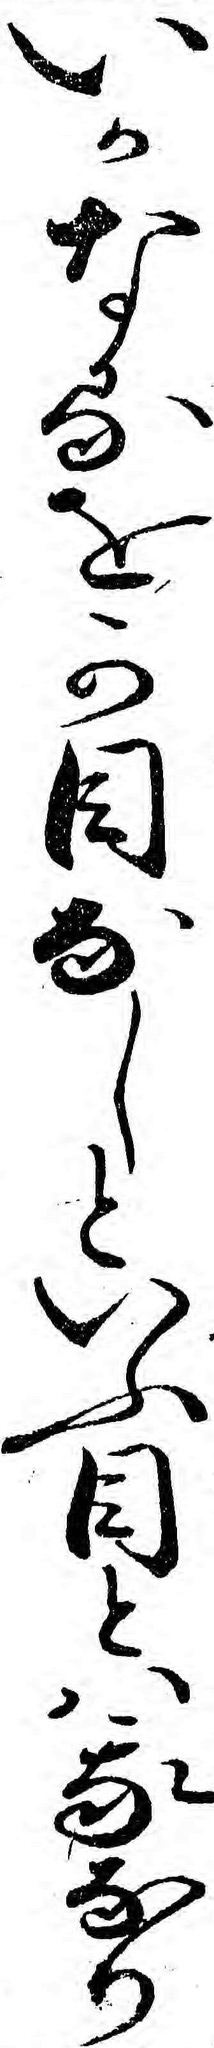いかなるをか目なしといふ目とは我なり
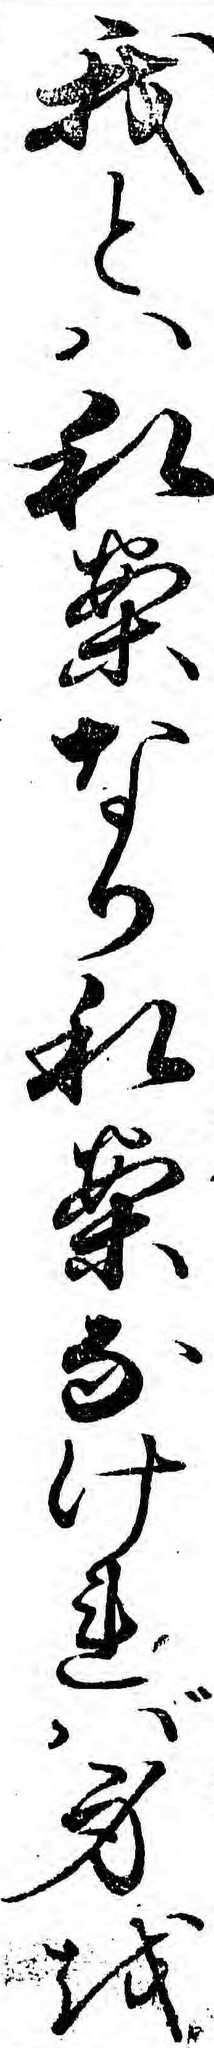我とは私案なり私案なければ身を
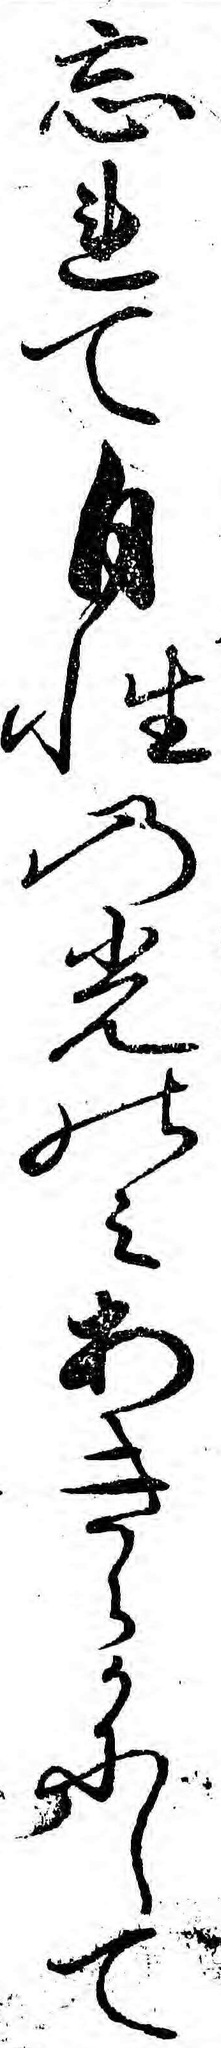忘れて自性の光のみあきらかにして
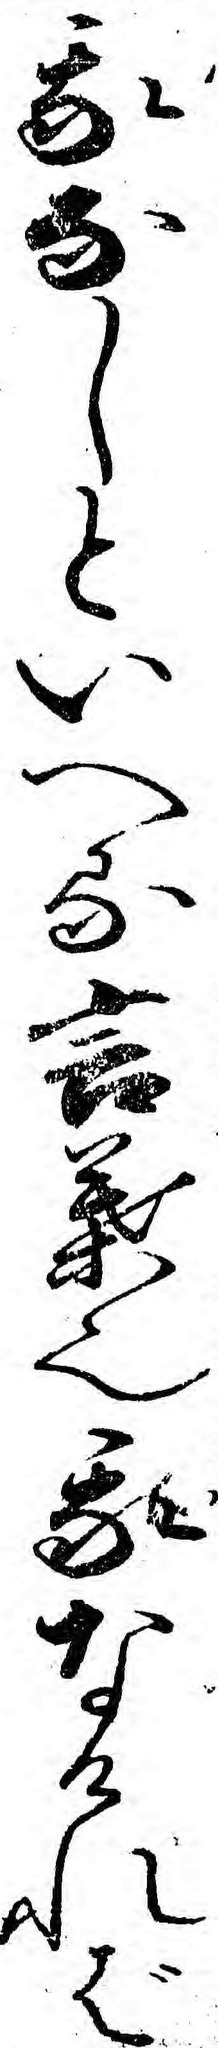我なしといへる言葉也我なけれ
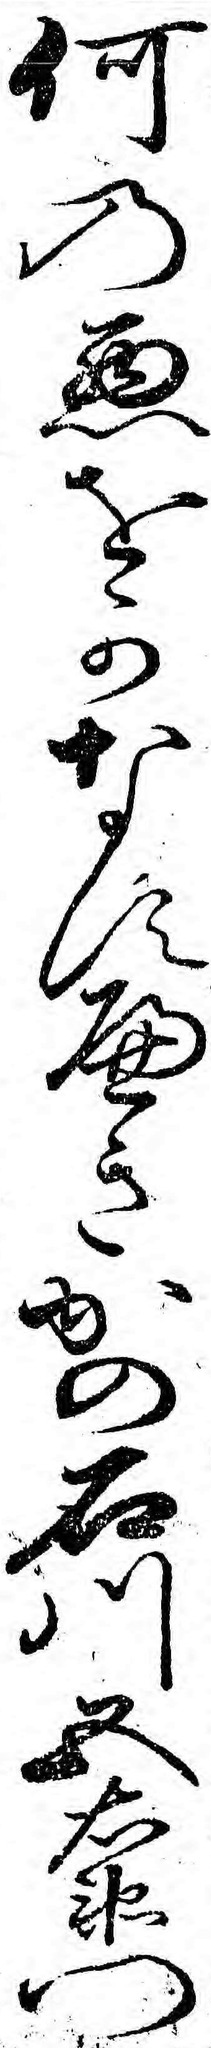何の悪をかなすべきかの石川五右衛門
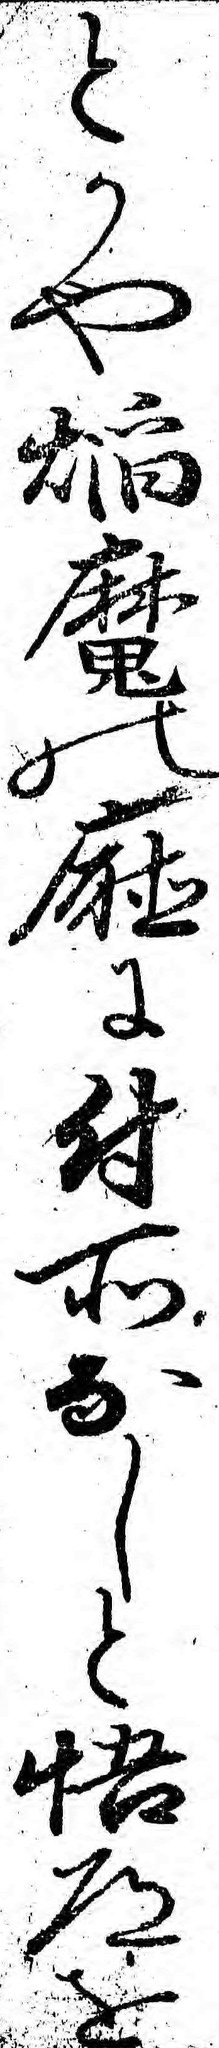とかや焔魔の庁に付所なしと悟道を

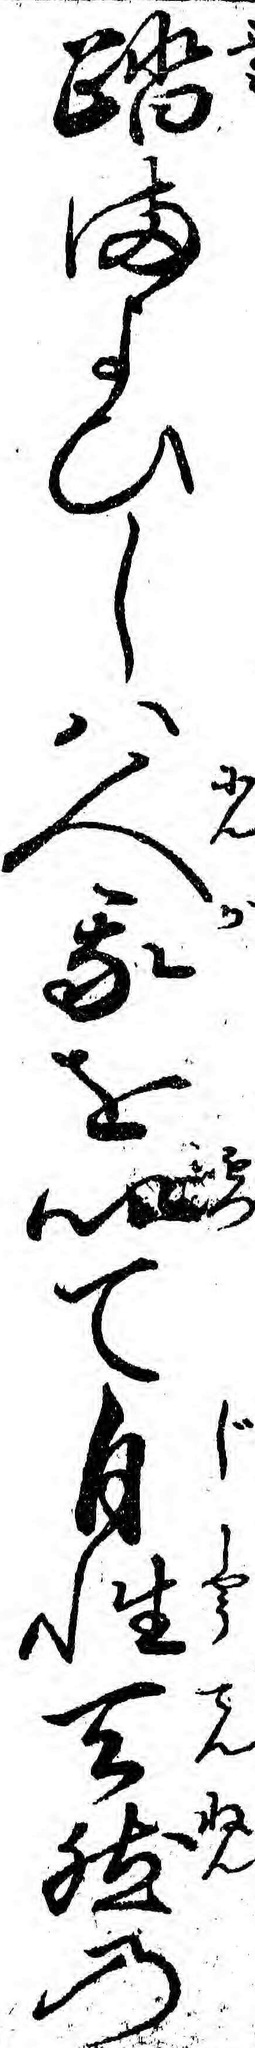踏まよひしは人家を以て自性天然の
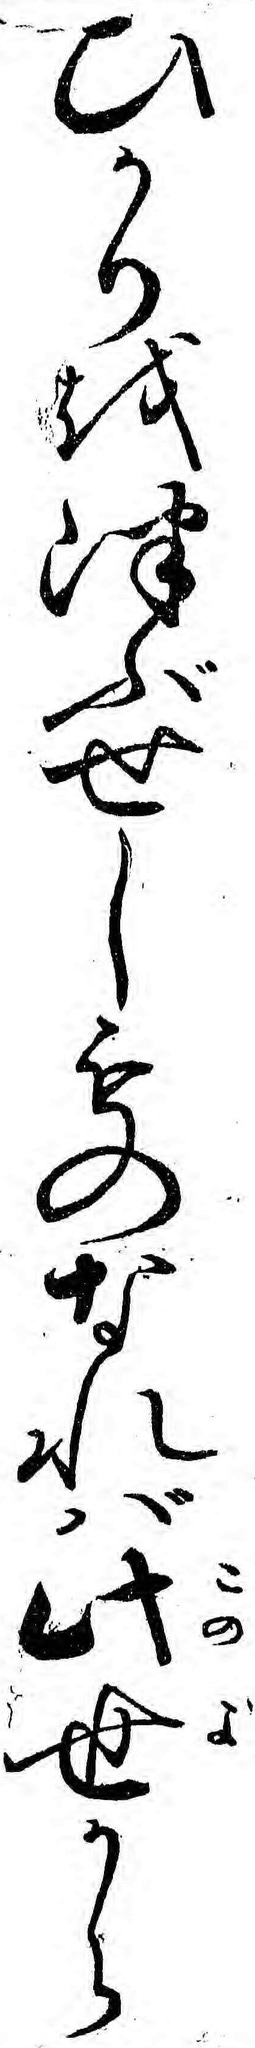ひかりをつぶせしものなれば此世から
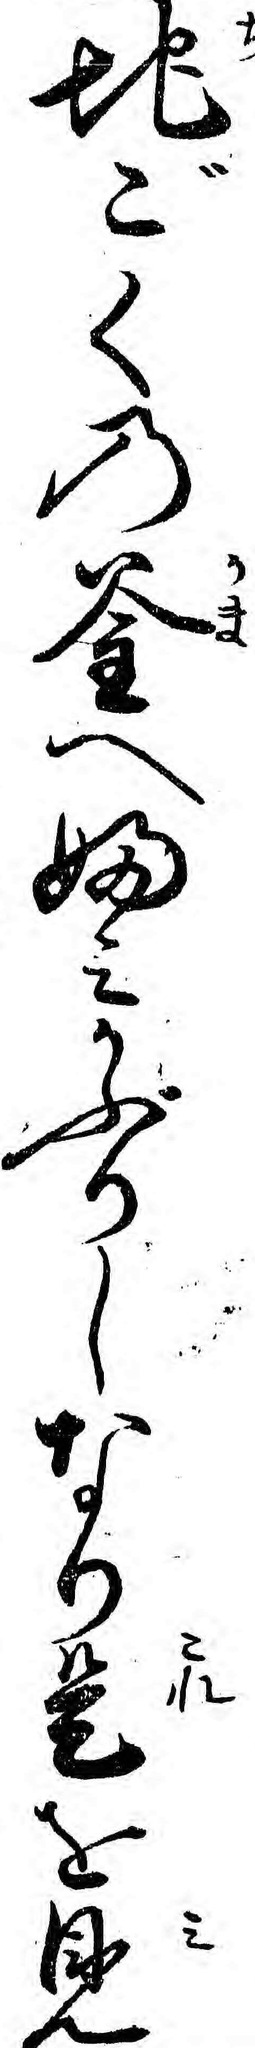地ごくの釜へふみかぶりしなり是を見
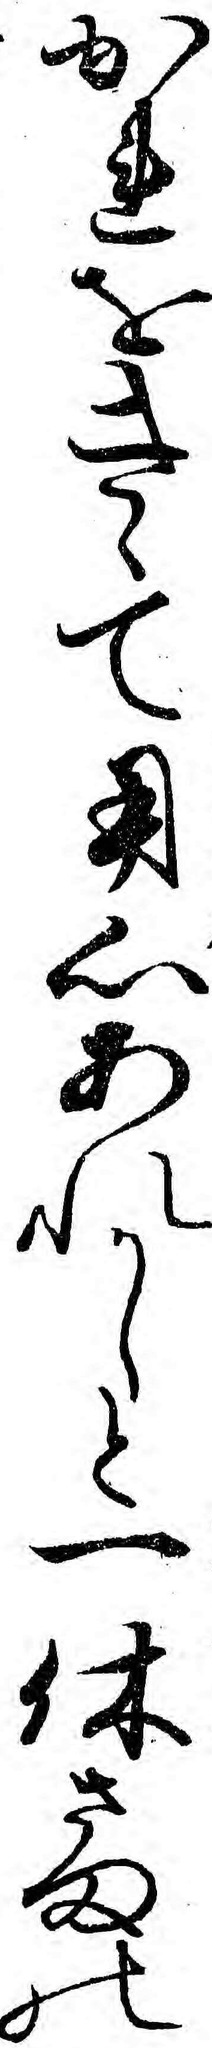かれをきゝて用心あれかしと一休さまの
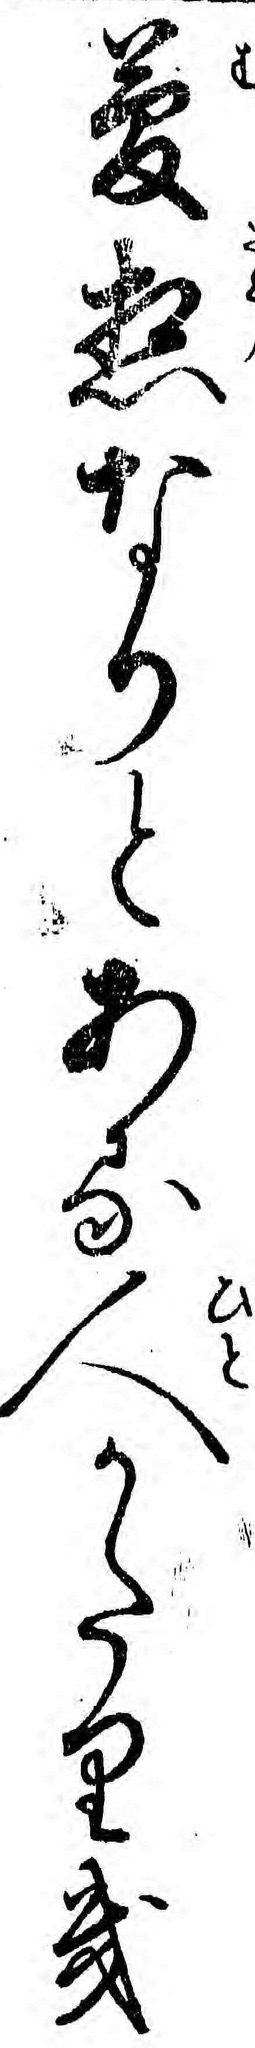夢想なりとある人かたりき
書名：目なし用心抄
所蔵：国文学研究資料館
